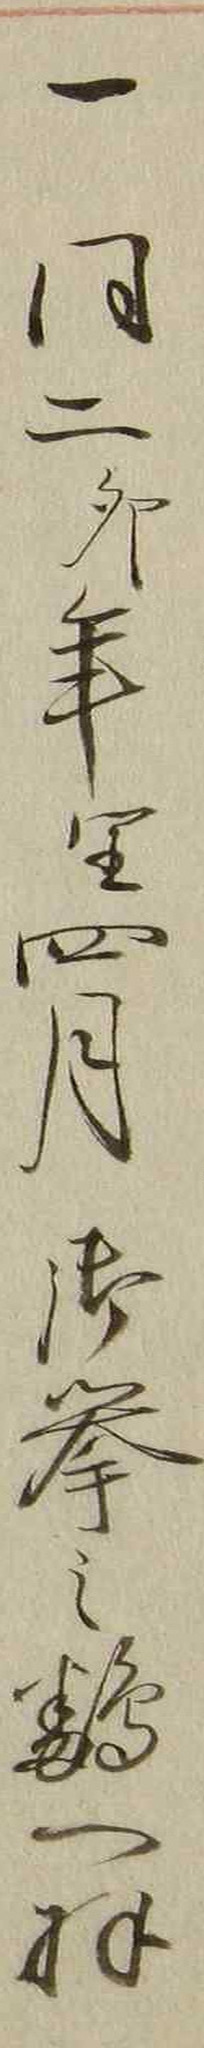一同二卯年閏四月御挙之鷭一羽
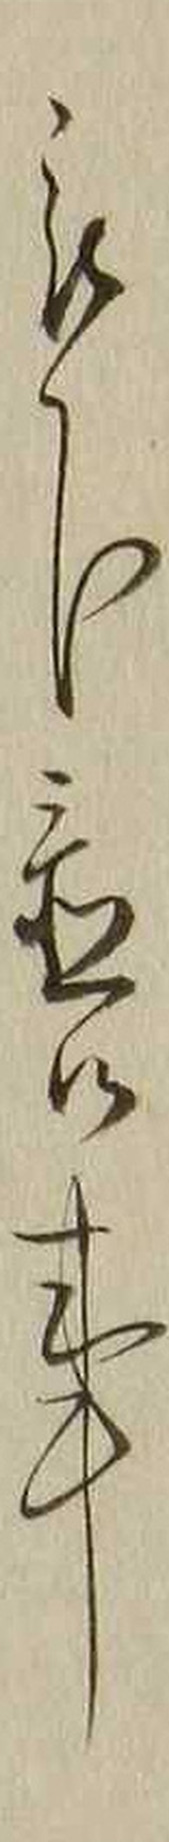被下置候事
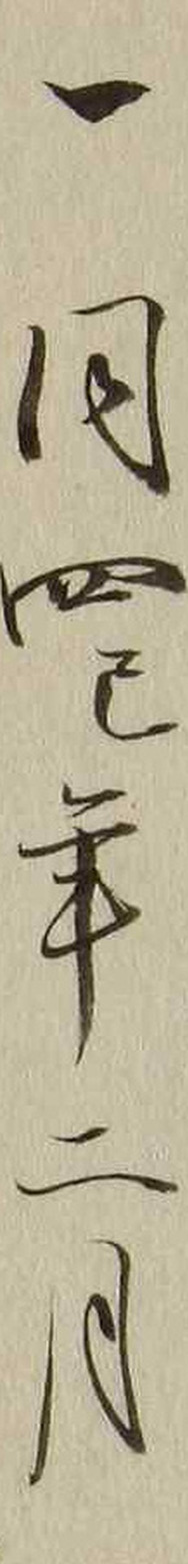一同四巳年二月
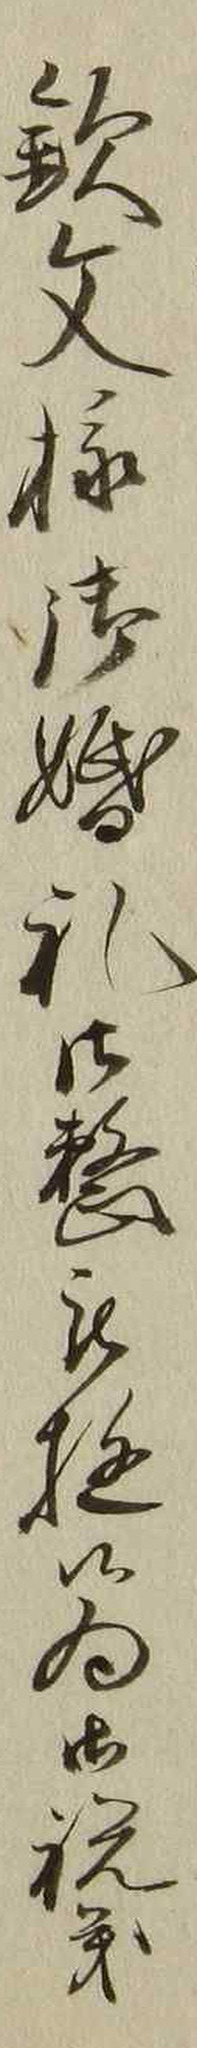欽文様御婚礼御整被遊候為御祝義
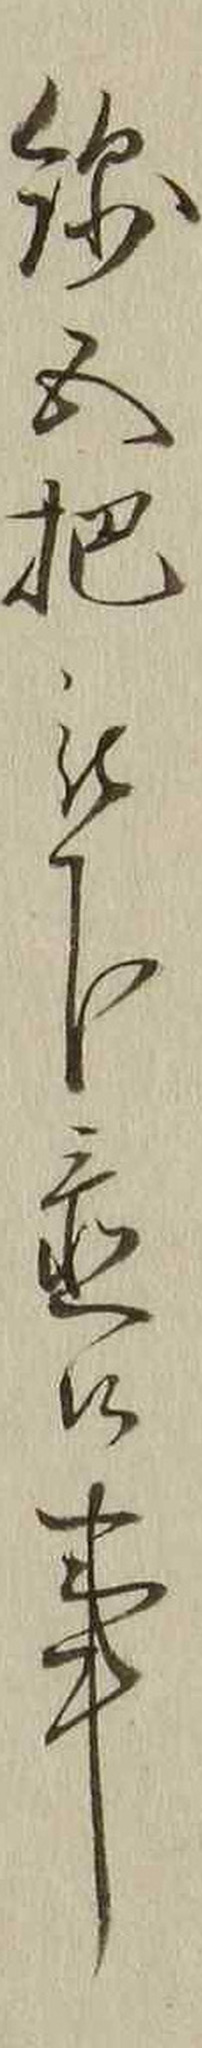綿五把被下置候事
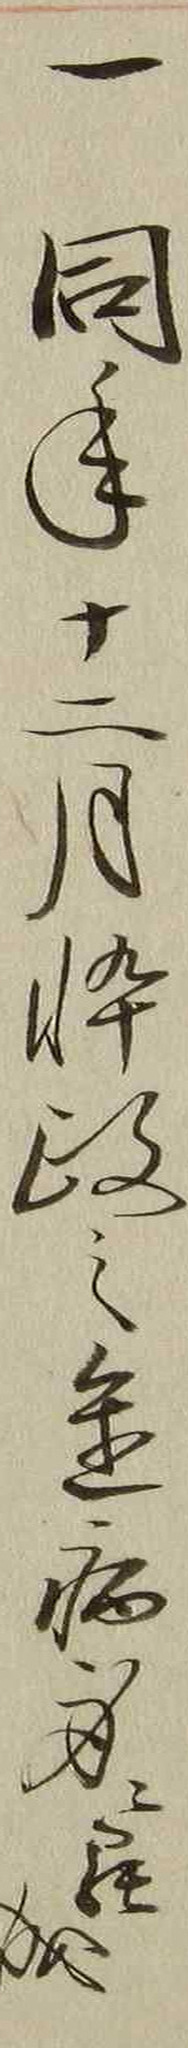一同年十二月忰政之進病身に罷成
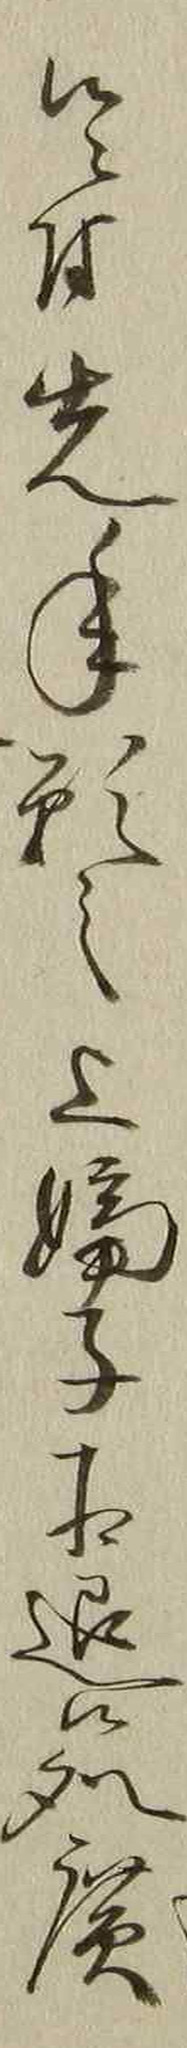候に付先年願之上嫡子相退候処広
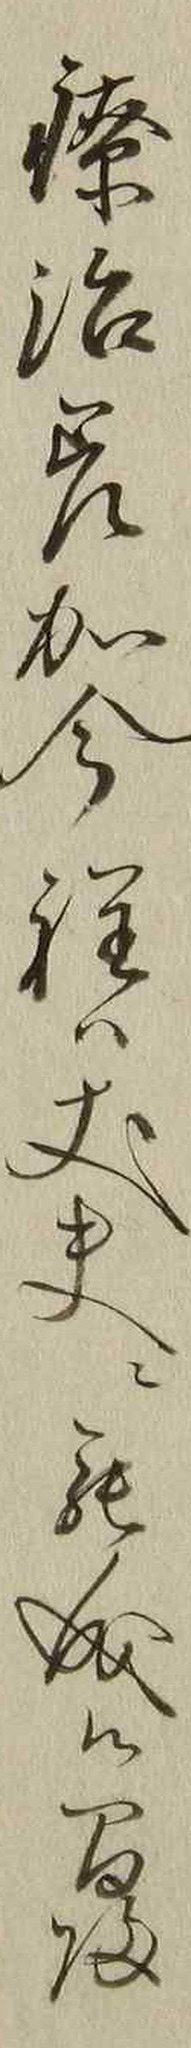療治差加今程は丈夫に罷成候間帰
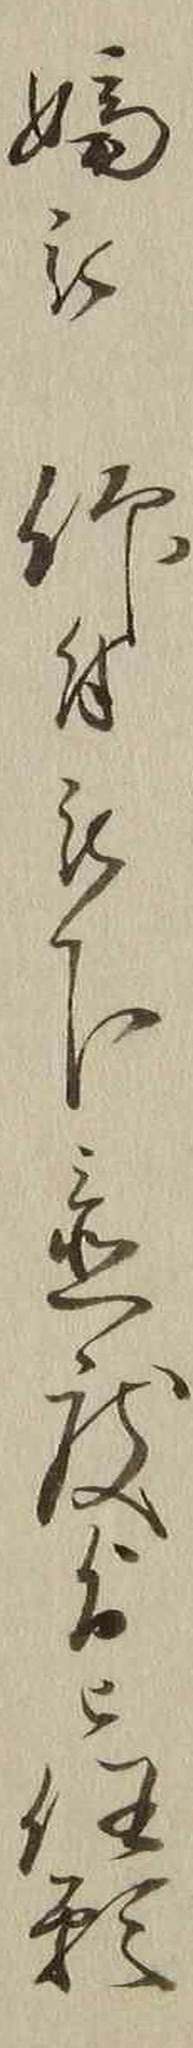嫡被仰付被下置度旨被任願
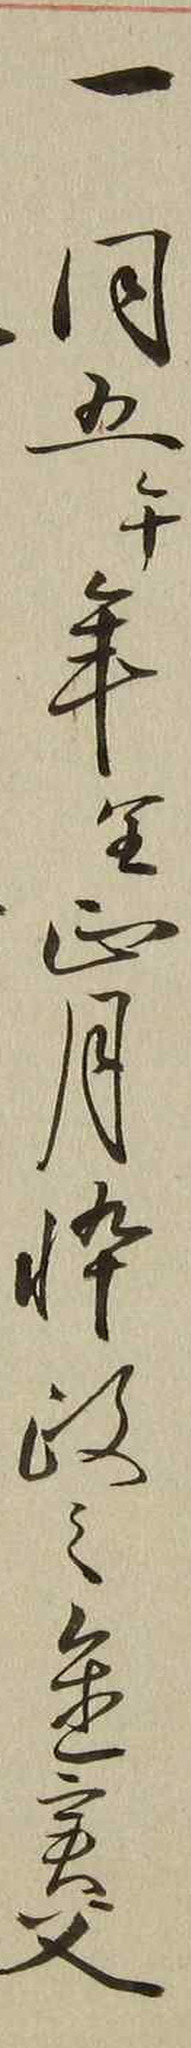一同五午年閏正月忰政之進実又
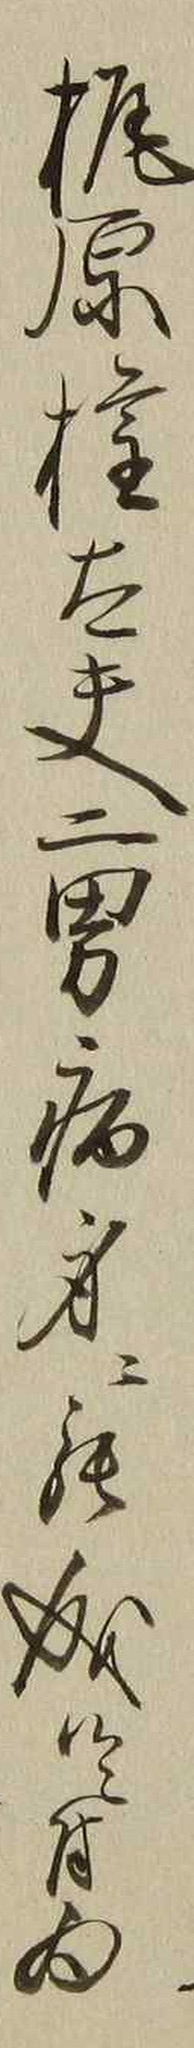梶原権太夫二男病身に罷成候に付為
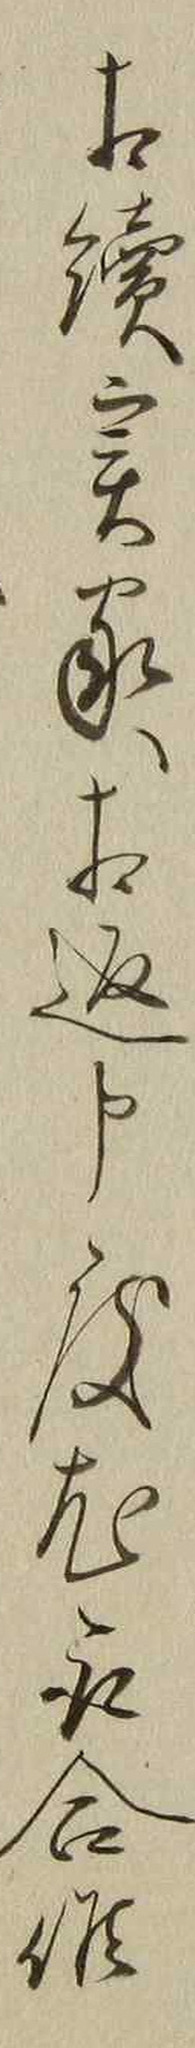相続実家へ相返申度尤取合候
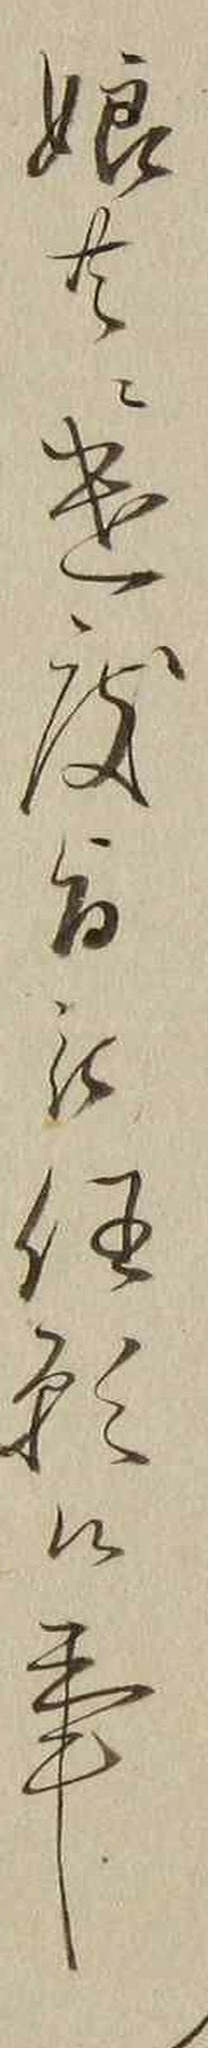娘共遣度旨被任願候事
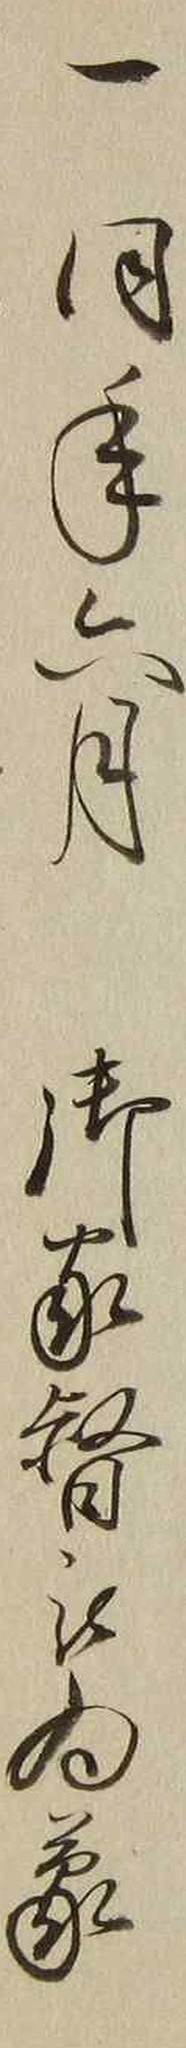一同年六月御家督被為蒙
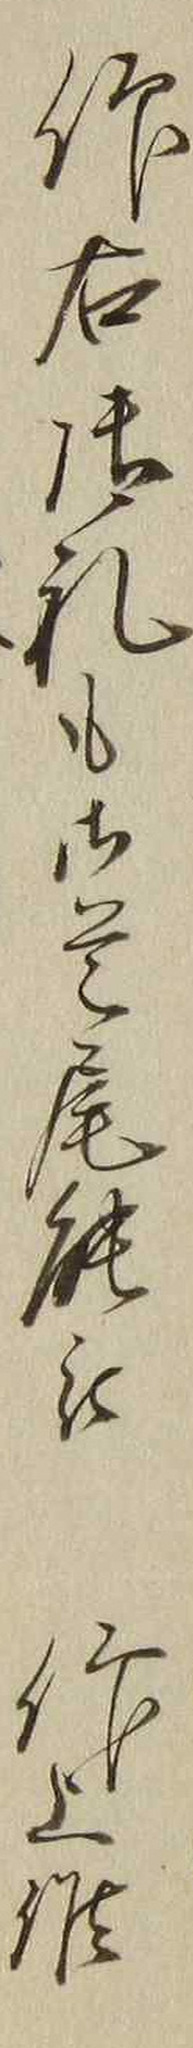仰右御礼も首尾能被仰上候
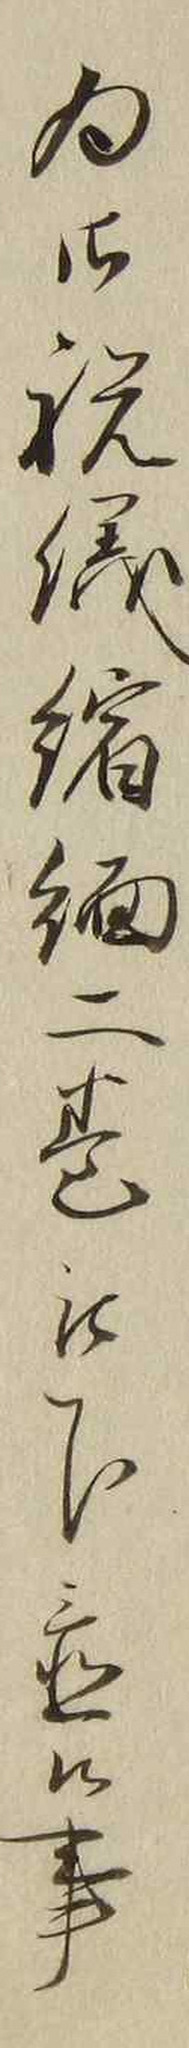為御祝儀縮緬二巻被下置侯事
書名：諸士系譜　巻之103　か之部11
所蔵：会津若松市立会津図書館
